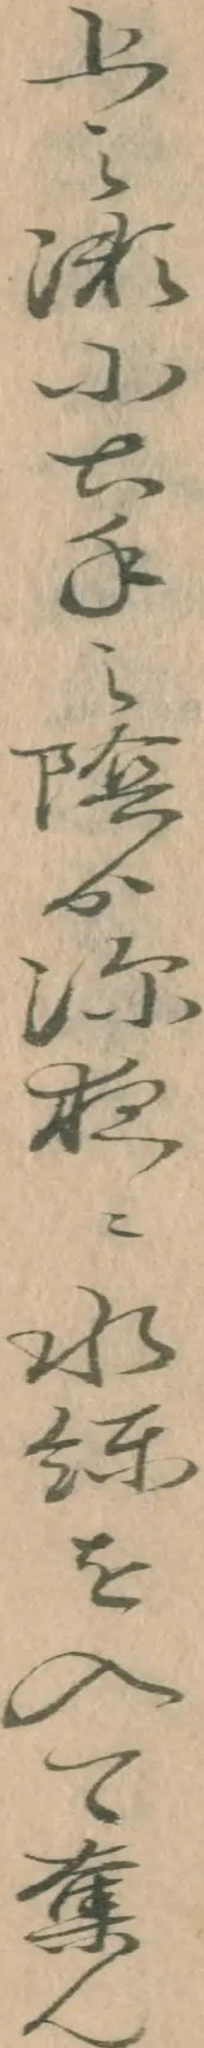上之瀬小土手之陰ゟ深夜に水練を入て奪ん
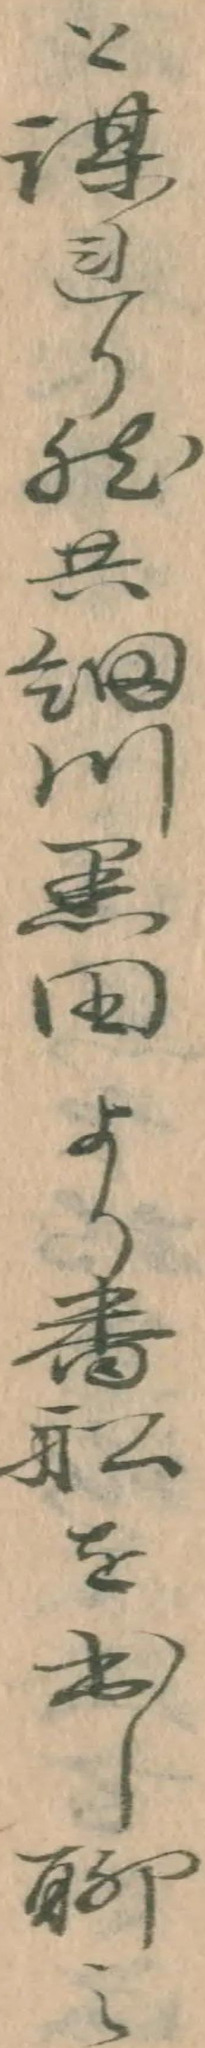と謀連り然共細川黒田より番舩を出し聊之
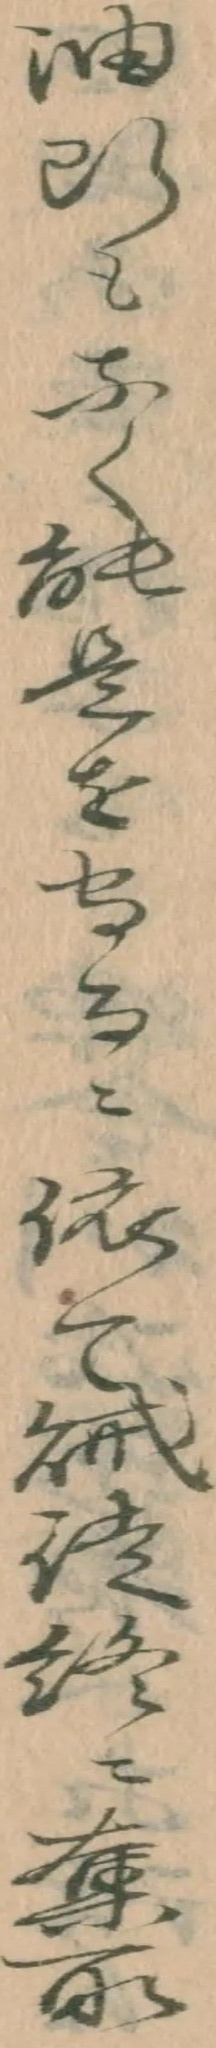油断もなく能是を守るに依て賊徒終に奪取
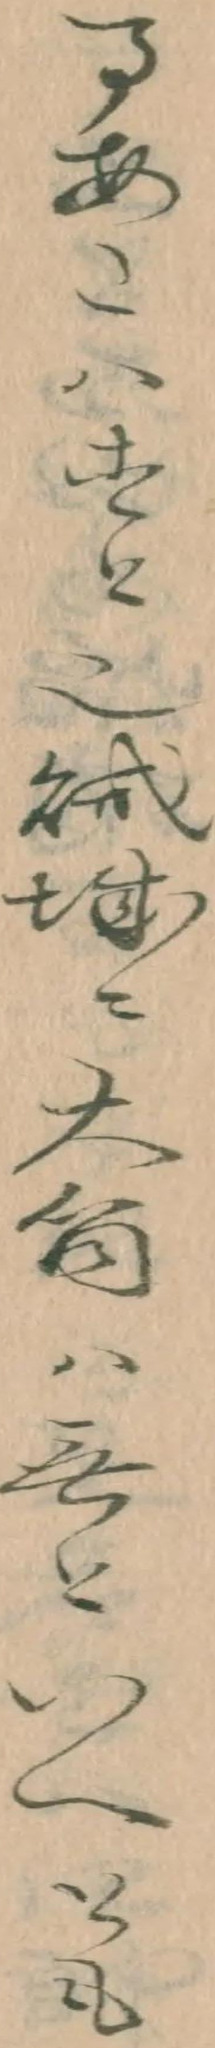事あたは春と也賊城に大筒は無といへとも
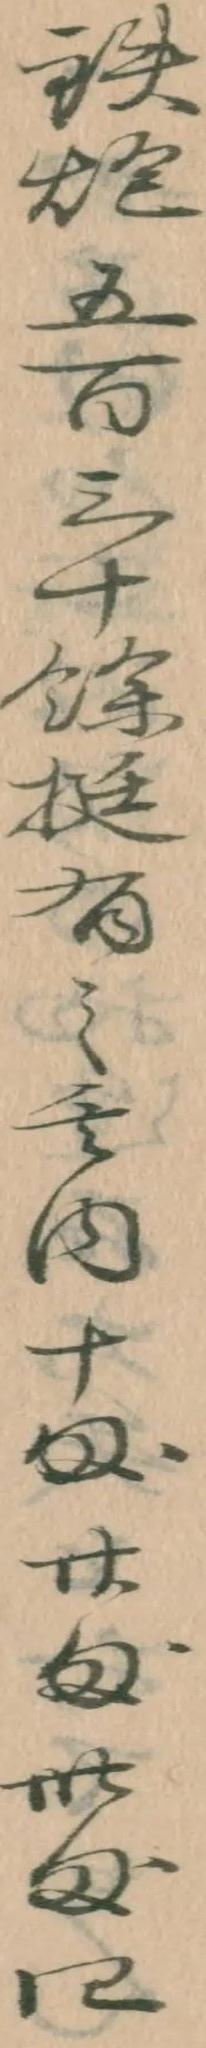鉄炮五百三十余挺有之其内十匁廿匁丗匁四
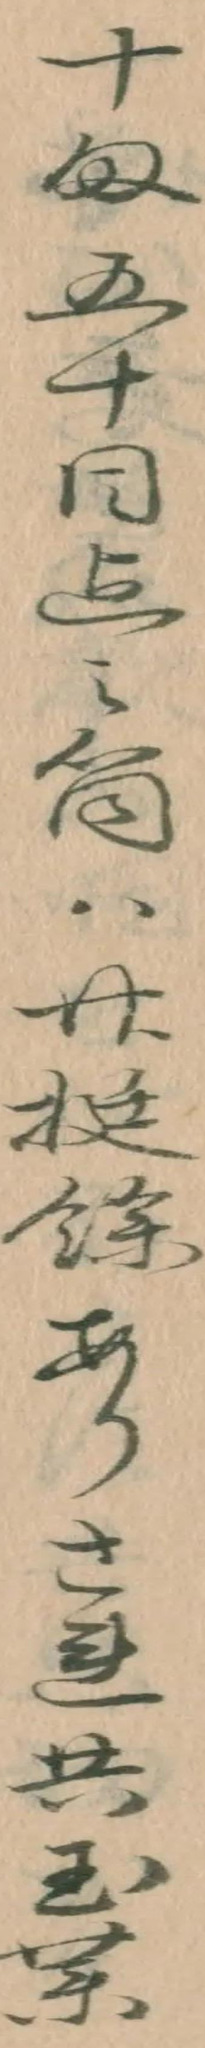十匁五十目迄之筒は廿挺余ありさ連共玉薬
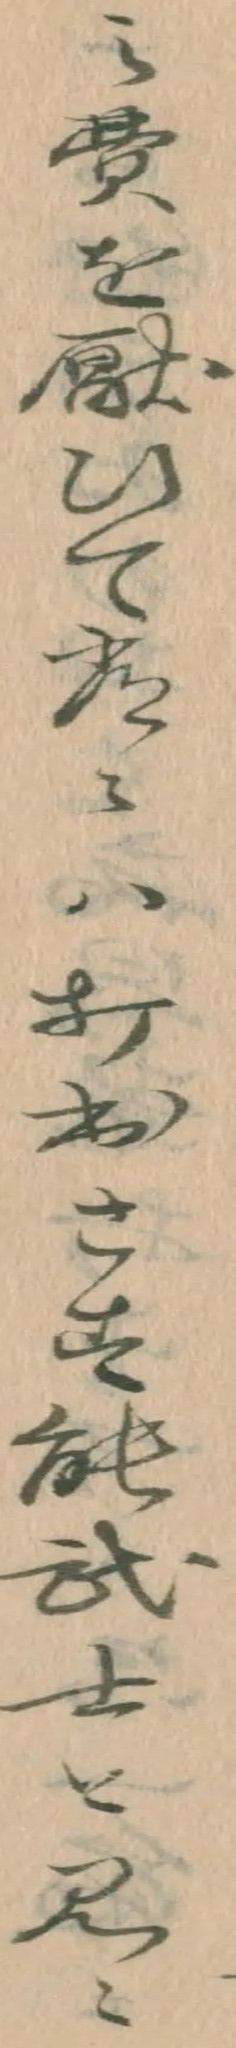之費を厭ひて常々は打出さ春能武士と見々
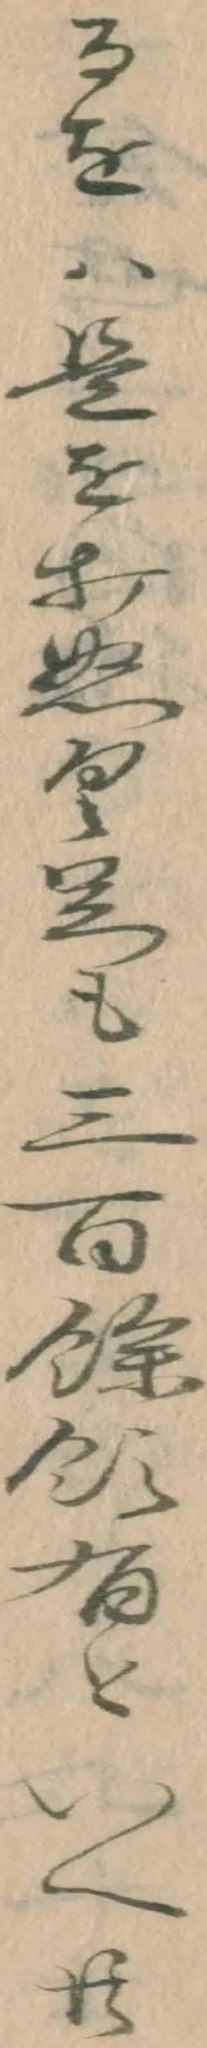るをは是を打懸具足も三百余領有といへ共
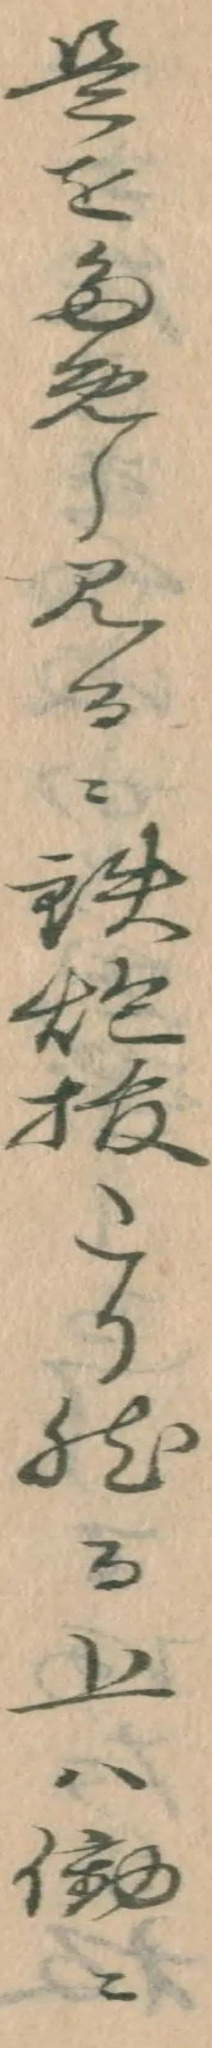是を多免し見るに鉄炮抜たり然る上は働に
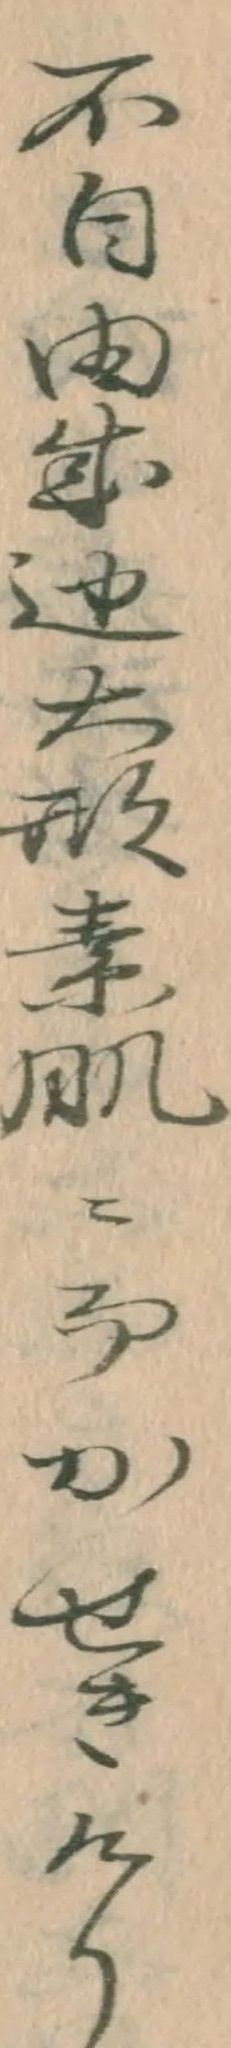不自由成迚大形素肌に而かせきけり
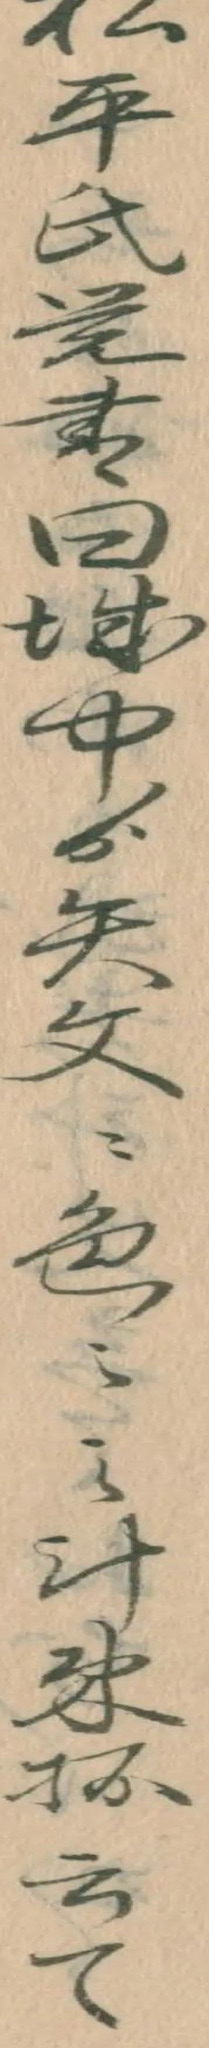松平氏覚書曰城中ゟ矢文に色々之斗束抔云て
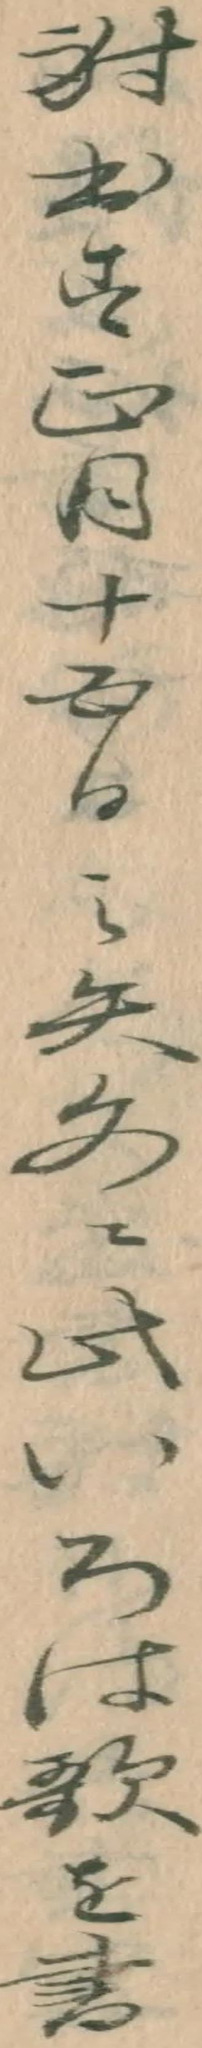射出春正月十五日之矢文に此いろは歌を書
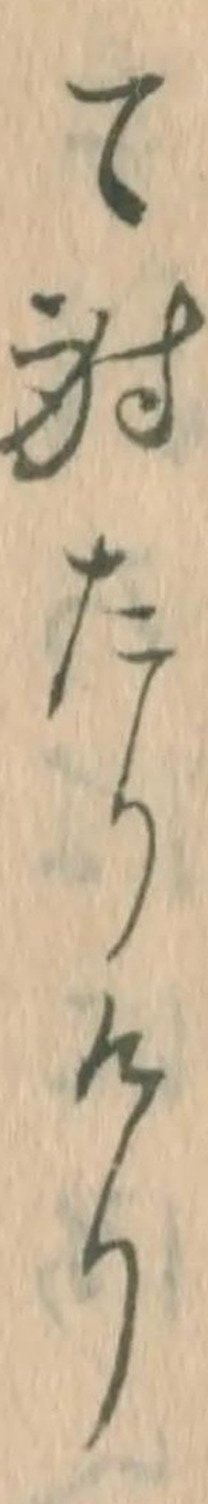て射たりけり

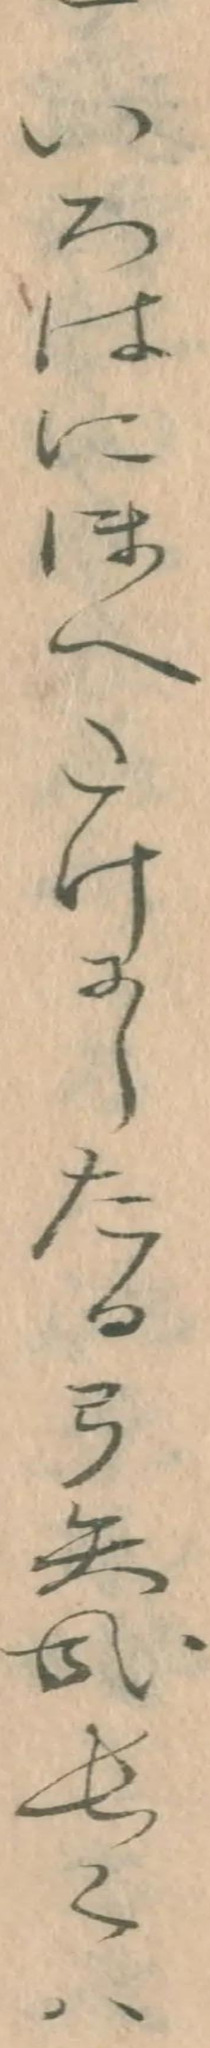一いろはにほへたけ尓したる弓矢哉長くは
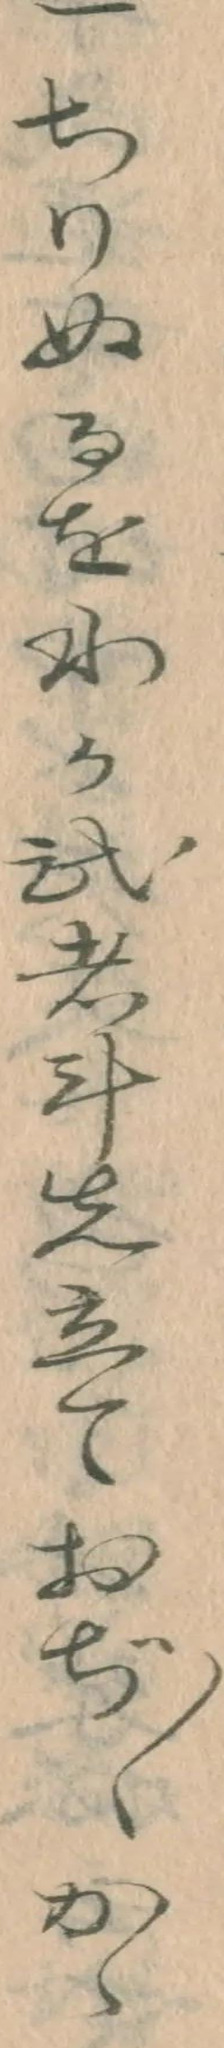一ちりぬるをわか武者斗先立ておぢ〱かゝ
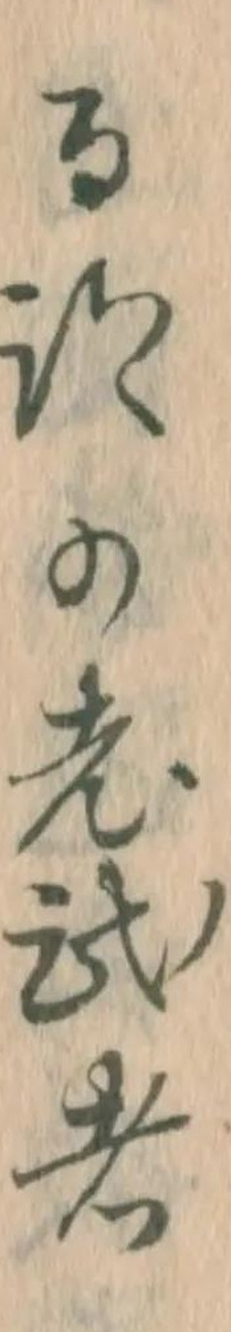る跡の老武者
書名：切支丹御退治記 49巻. [6]
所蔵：国立国会図書館 National Diet Library, JAPAN
